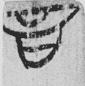言
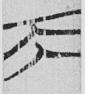天
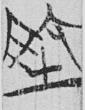地
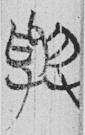與
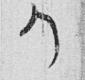人
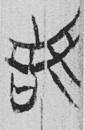若
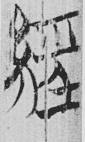經
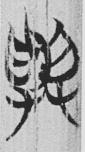與
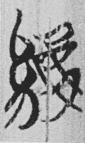緯
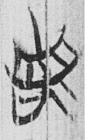若
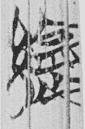○（表）
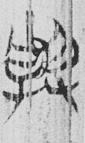與
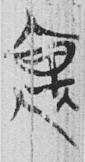裏
